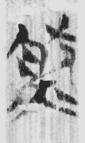然
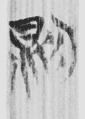則
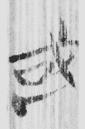或
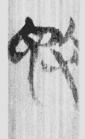{它攴}
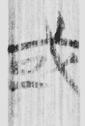或
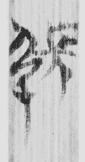張
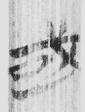或
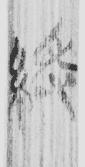緩
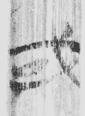或
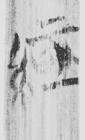{糸亟}
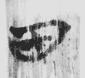田
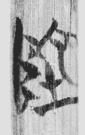地
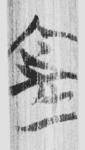{宀之𡈼}
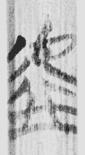虛
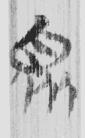眾
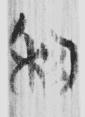利
